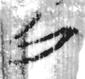㠯
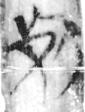死
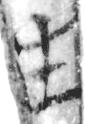生
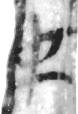才（在）
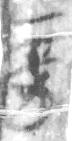梄（酉）
